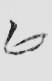㠯（以）
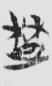楚
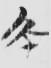帀（師）
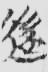○（後）
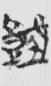○（城）
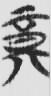奠
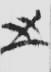之
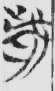歲（歲）
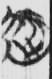○（屈）
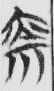○（夕）
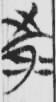之月
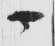丁
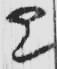巳
